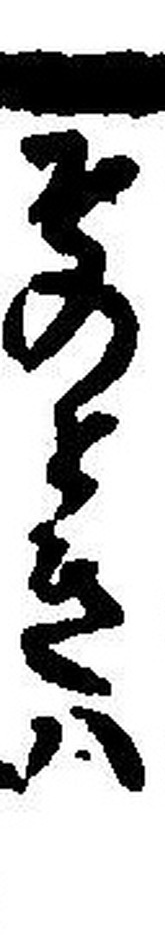そのときは
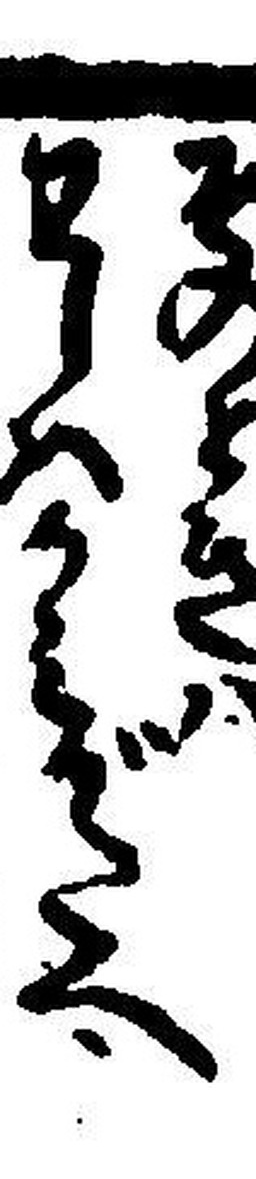わしはかみがたへ
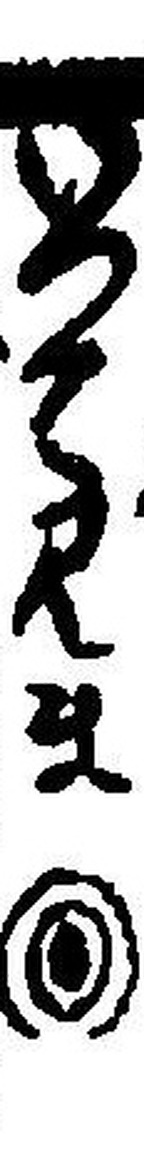いつて見ま
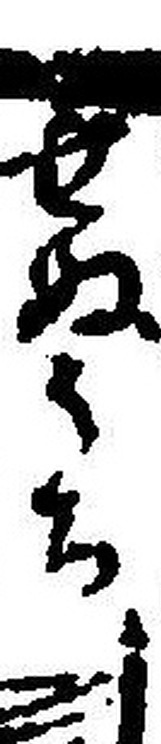せぬうち
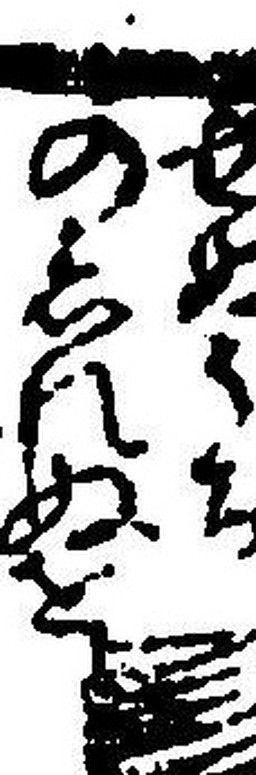のしれぬを
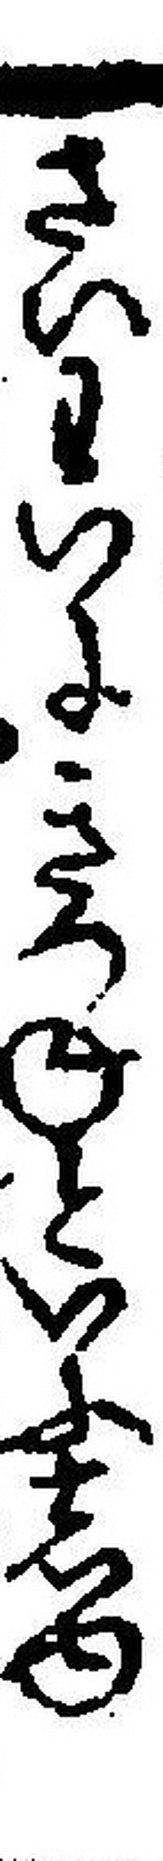さいわいにきつねといふしゆ
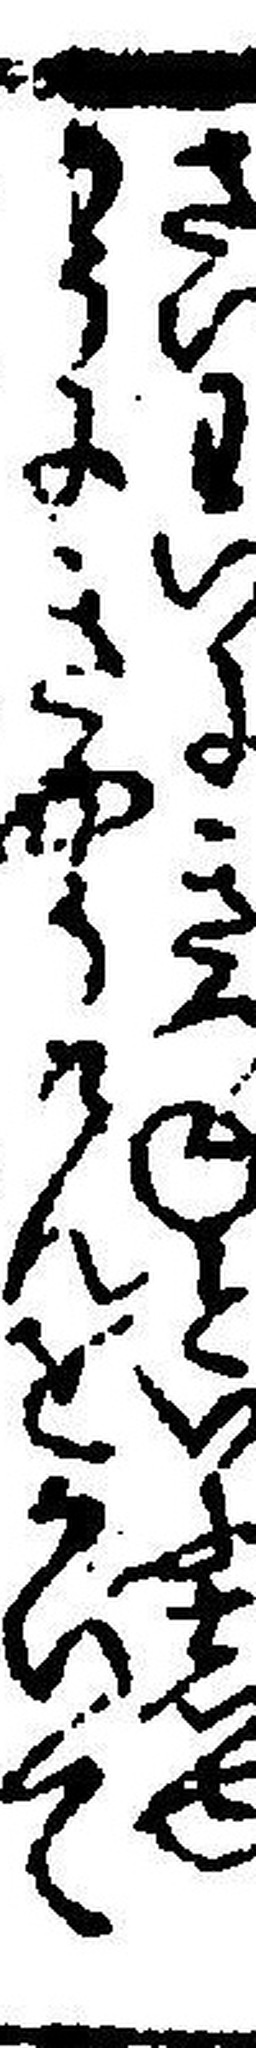かうにきやうけんをかいて
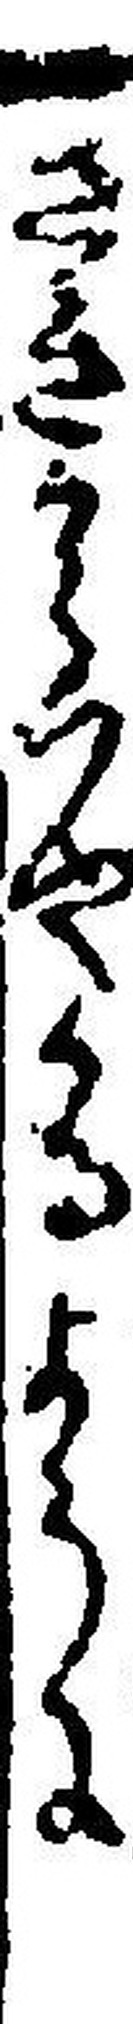さきからいやかるように
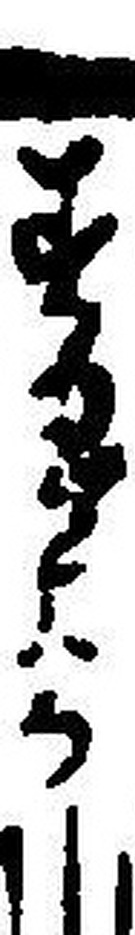するかよか
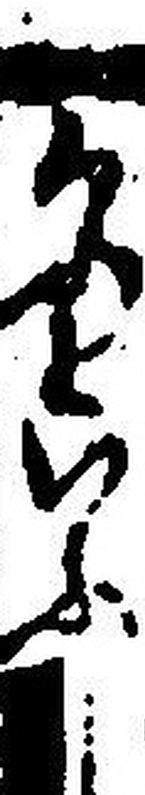ろふといふ
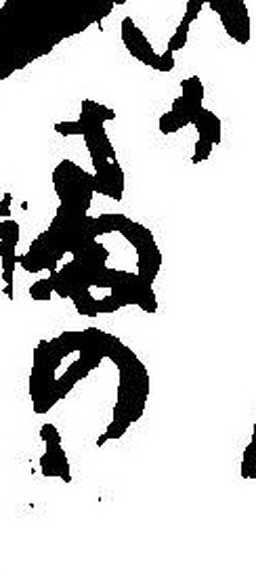さまの

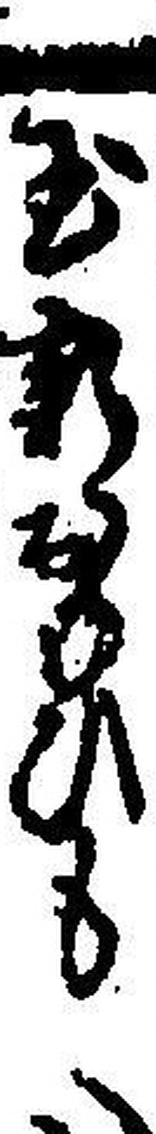玉新おもひも
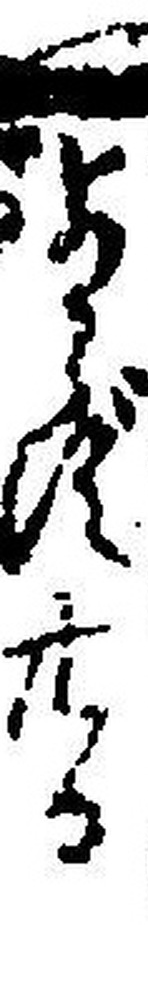よらず廿日
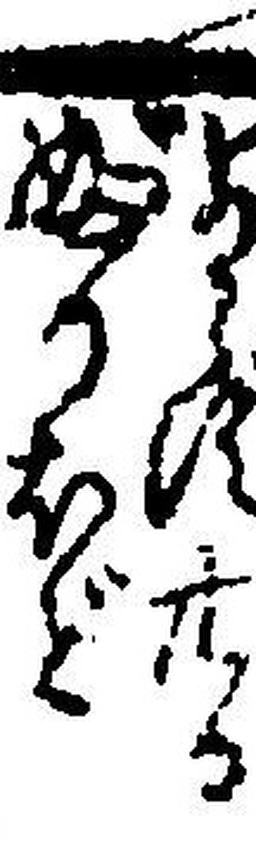ぶりほど
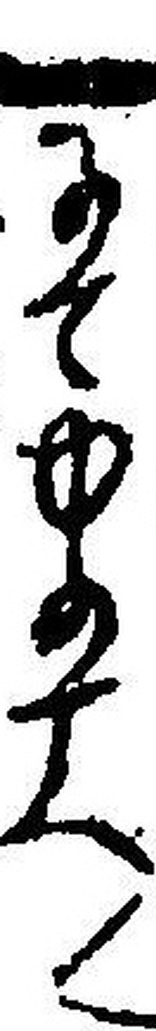にて中の丁へ
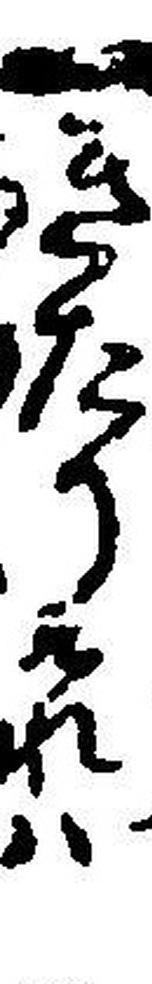きたりけれは
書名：間違狐之女郎買 / 市場通笑作
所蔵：東京大学総合図書館 General Library in the University of Tokyo, JAPAN
